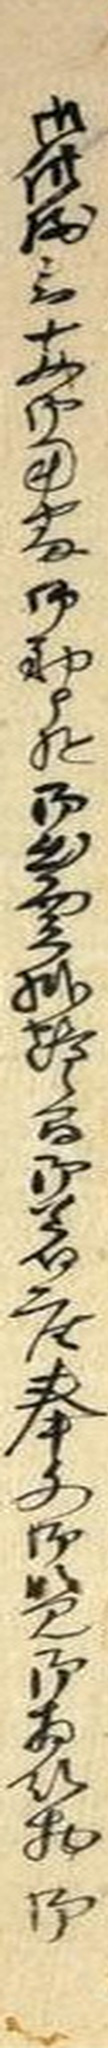御供揃二而両御用番御勤被遊御出殿掛鶴之間御着座奉文御覧御拝領物御
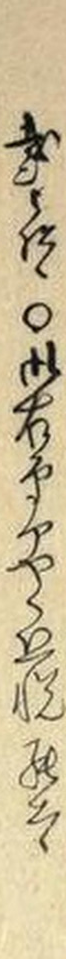戴被遊候〇御右筆部やへ恐悦罷出候
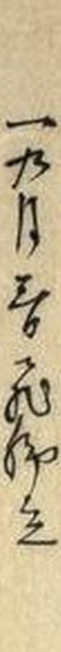一九月三日飛脚立
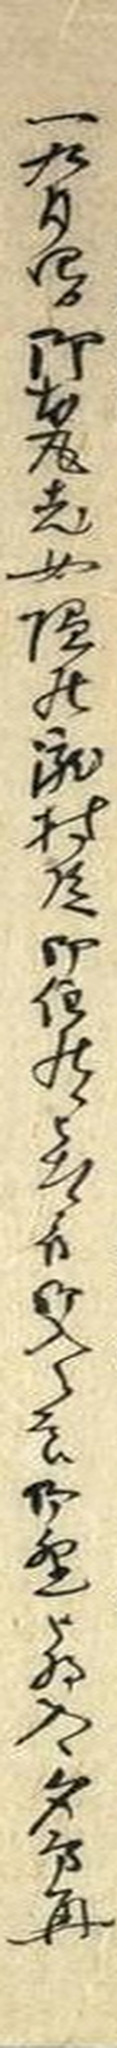一九月四日御本丸老女隠居瀧村殿御住居へ被出候付御入之節御逢被為入候夕方再
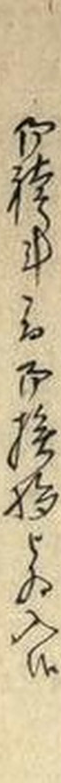御袴斗二而御挨拶被為入候

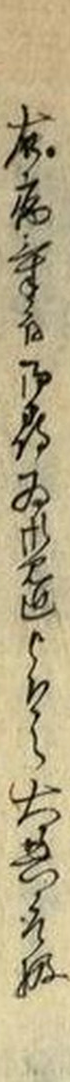右病気ニ付御尋為御見廻被下之大奥取扱
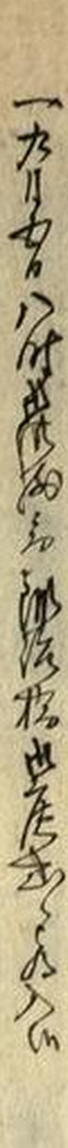一九月五日八時御供揃ニ而鍛冶橋御広式被為入候

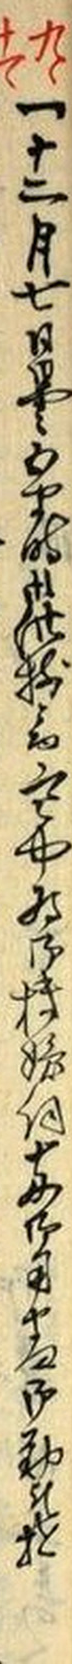一十二月七日曇五半時御供揃ニ而寒中為御機嫌伺両御用番御勤被遊
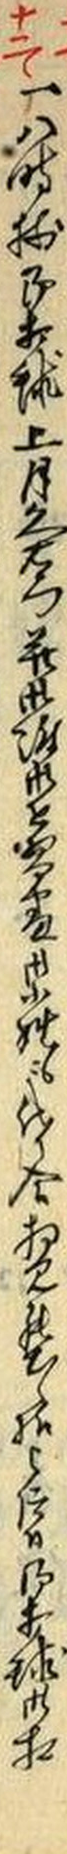一八時揃御打毬上月久右衛門并御附御近習番御小姓も代り合拝見罷出候様被仰付御打毬御相
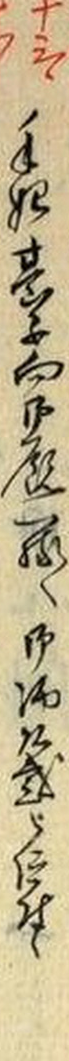手始台子向御厩一統へ御酒頂戴被仰付候
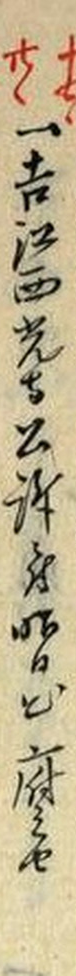一吉江西光寺公訴ニ付昨日出府之由
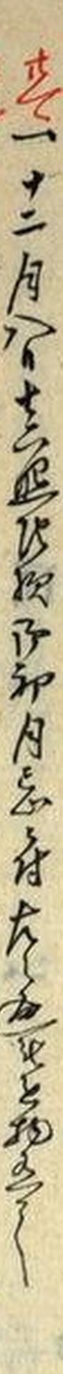一十二月八日真照院様御初月忌ニ付左之通被進物有之
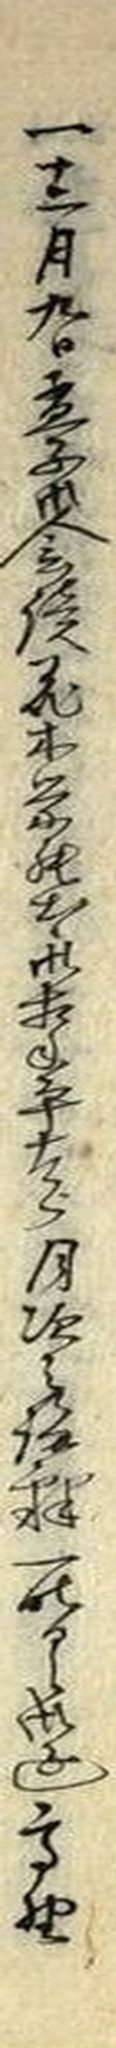一十二月九日孟子御会読花木栄罷出候御相手平太郎月次之講釈一昨日之御延高野
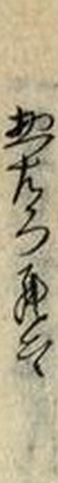惣左衛門罷出候
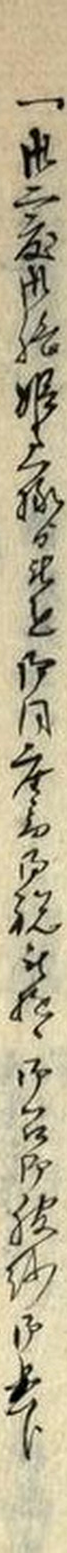一御二度御膳姫君様ゟ被進御同座ニ而御祝被遊候御召御服紗御上下
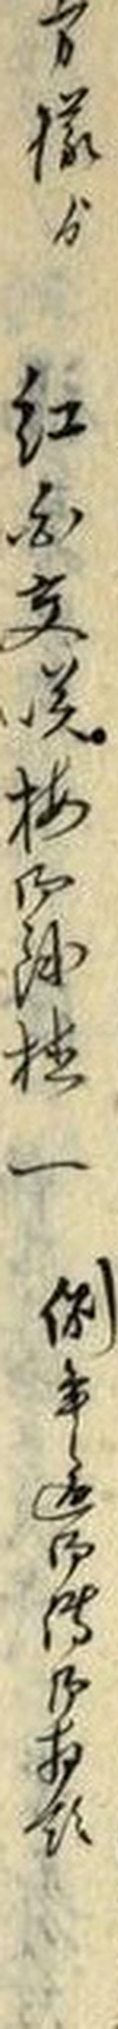公方様ゟ紅白交咲梅御鉢植一例年之通御伝御拝領
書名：少傅日録抄（斉承付側向頭取日記、在府）
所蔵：福井県文書館 Fukui Prefectural Archives
